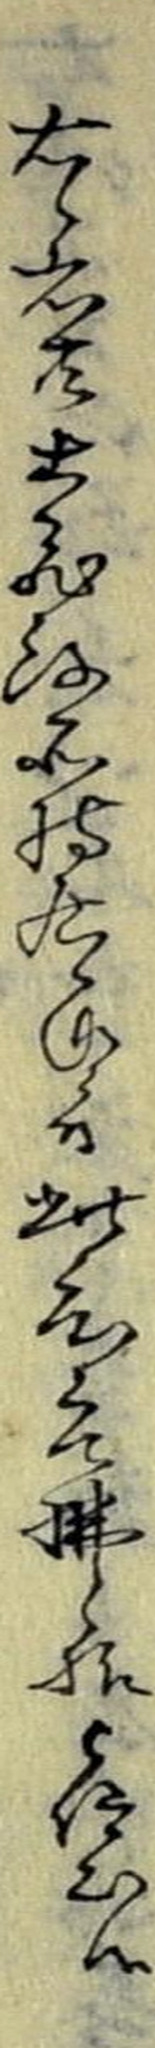右之者共土蔵致所持居候趣に付此度取払候様被仰出候
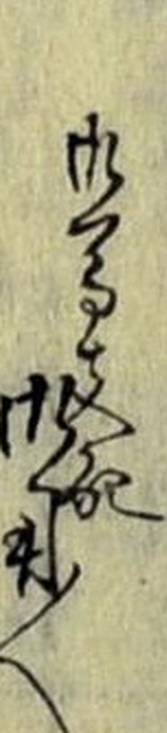御馬支配御用人
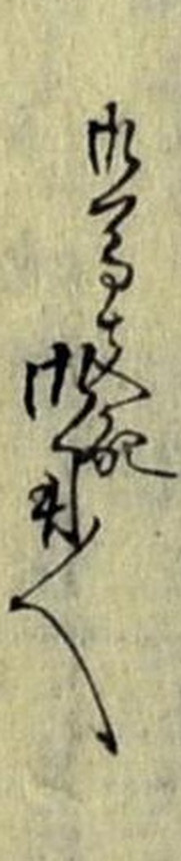御馬支配御用人
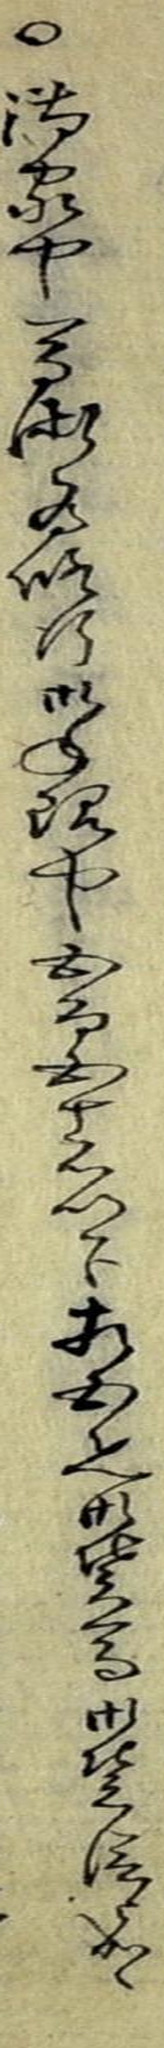○御家中馬術為修行御年限中五百五十石以下拾五疋御貸馬御貸被成候
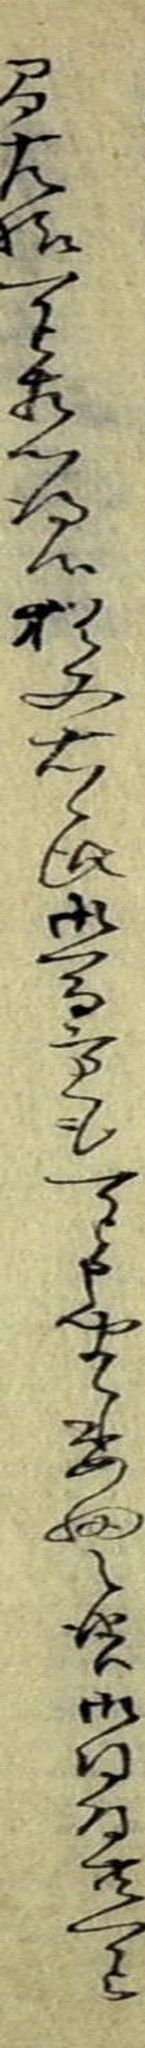間左様可被相心得候猶又右之趣御馬方へも可被申聞候委細之儀は御目付共可被
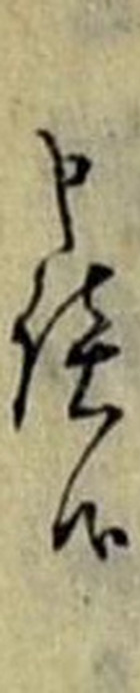申談候
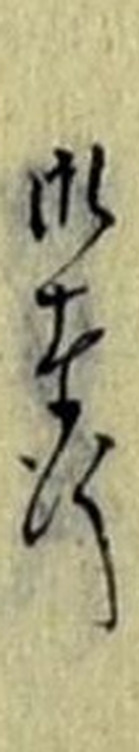御奉行
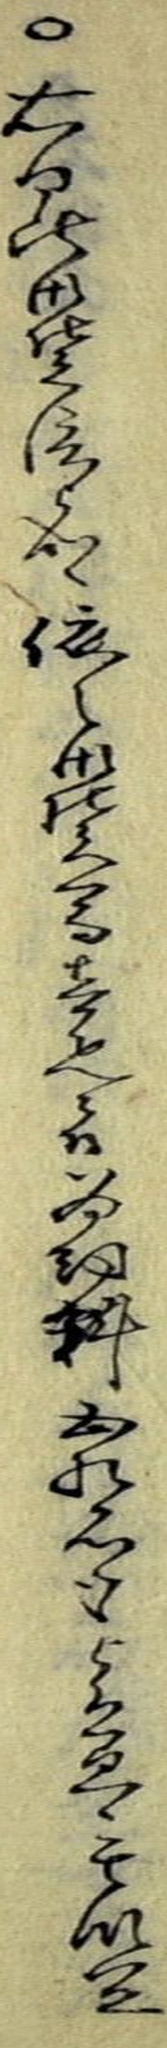○右同断御貸渡被成候依之御貸馬壱疋に付飼料五拾石つヽ被下置候其段宜

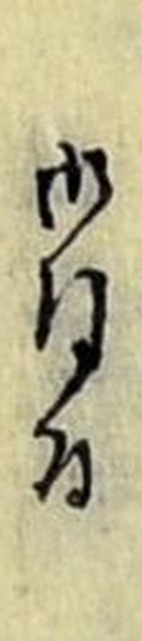御目付
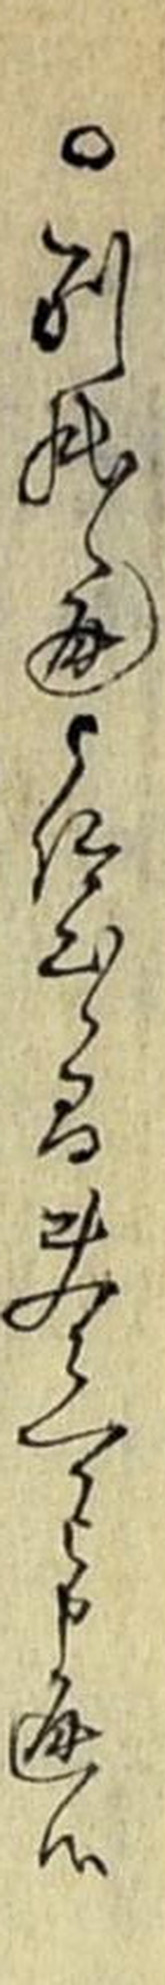○別紙之通被仰出候間夫々可被申通候
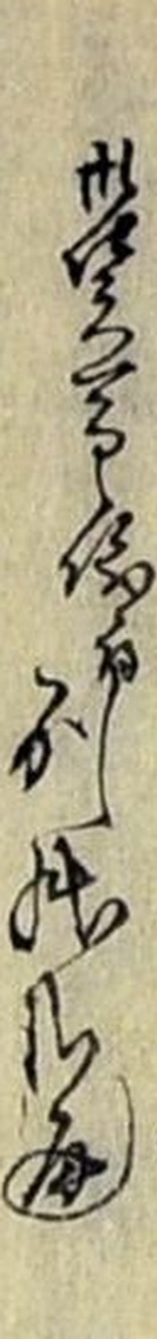御貸馬之儀に付別紙弐通
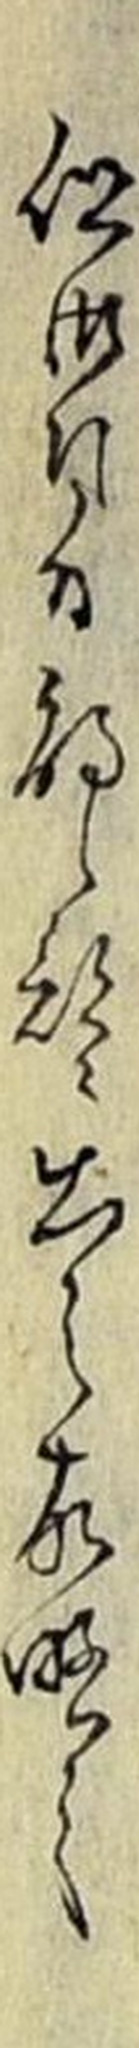但御目付触之部に出之故略之
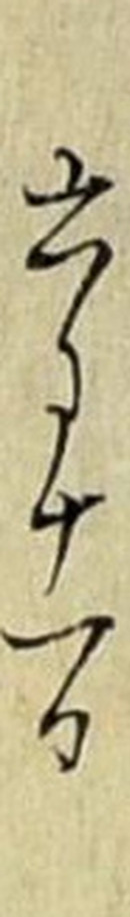六月十一日
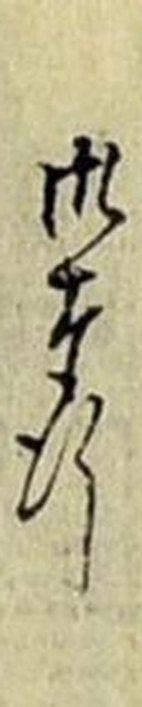町奉行
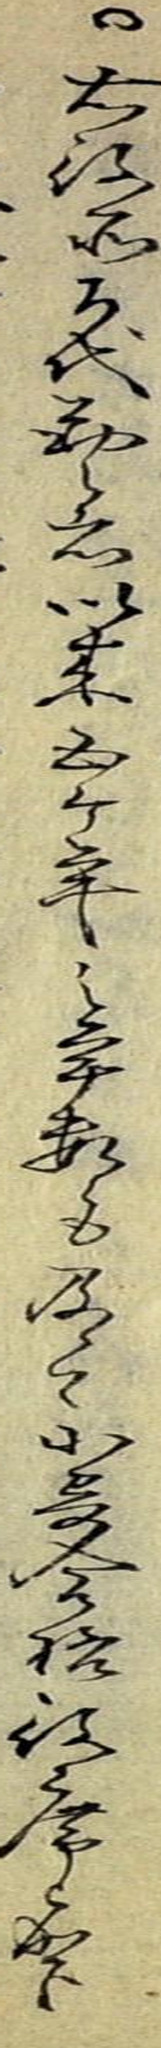○右役所下代勤之者以來五ヶ年之年数にも及候はヽ小寄合格役席被成下
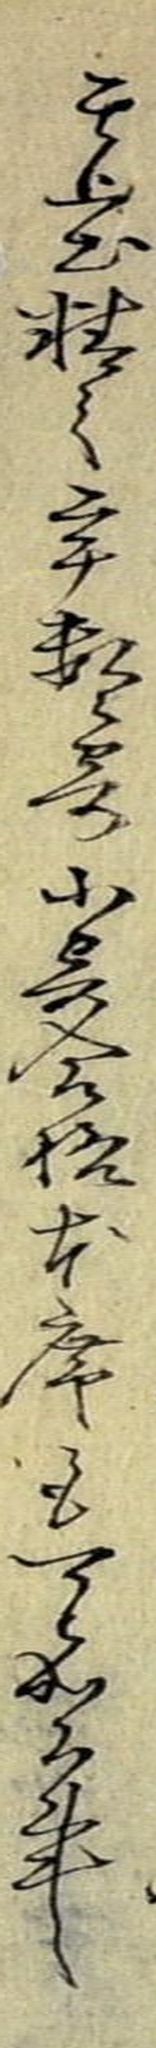其上出精之年数に寄小寄合格本席にも可被成下事
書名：命令之部 六
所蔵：福井県文書館 Fukui Prefectural Archives
